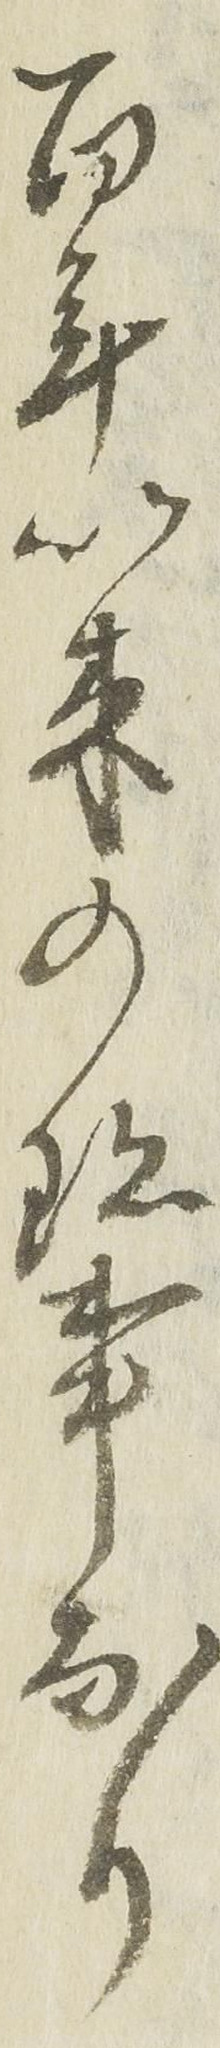百年以来の珍事なり

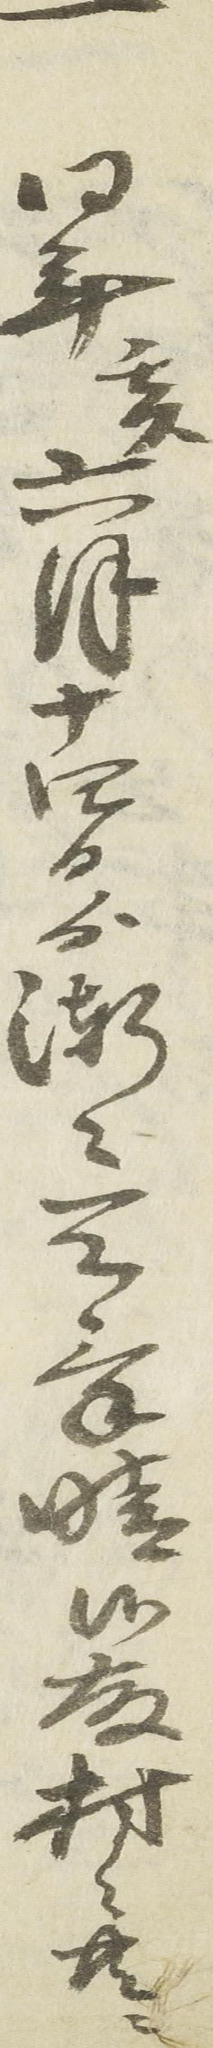一同年亥六月十四日ゟ漸々天気晴候故村々共ニ
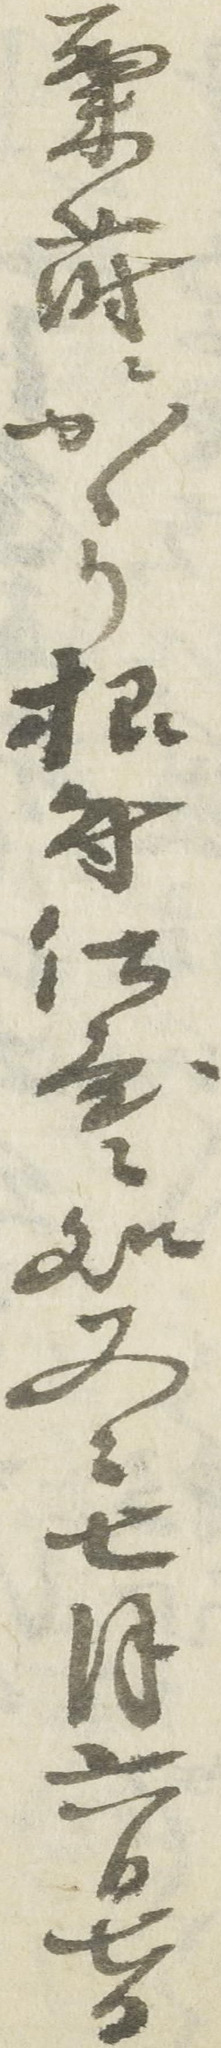粟蒔ニかゝり根付仕置候処又々七月六日七日
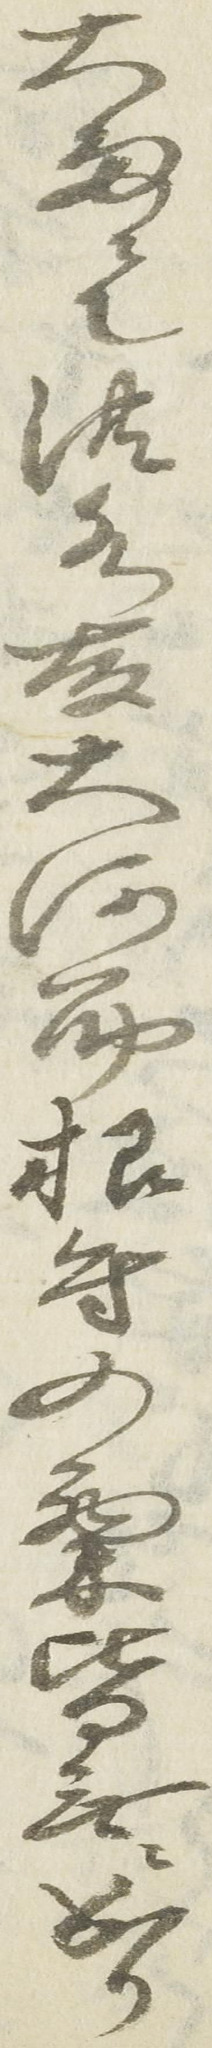大雨ニて洪水故大河筋根付の粟皆無ニ成り
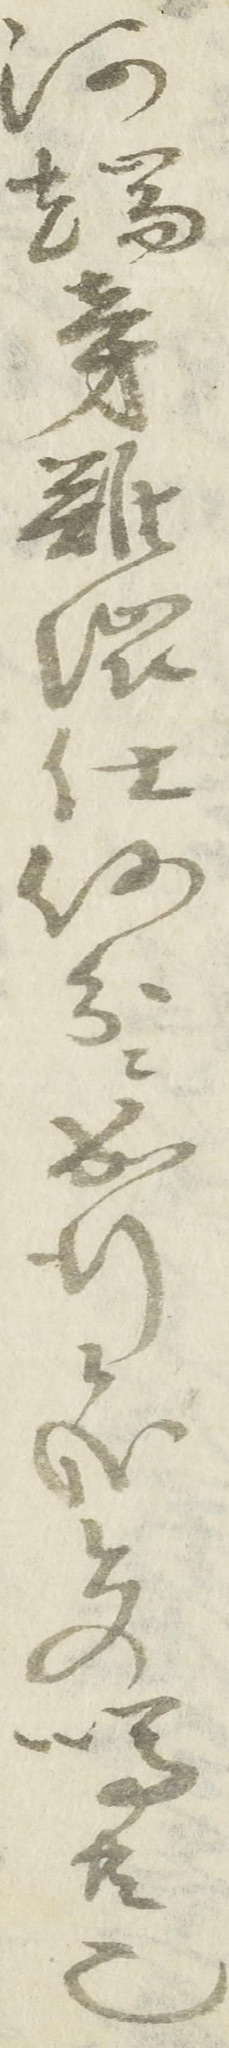河端方旁難渋仕何分ニ成行候哉との噂共也
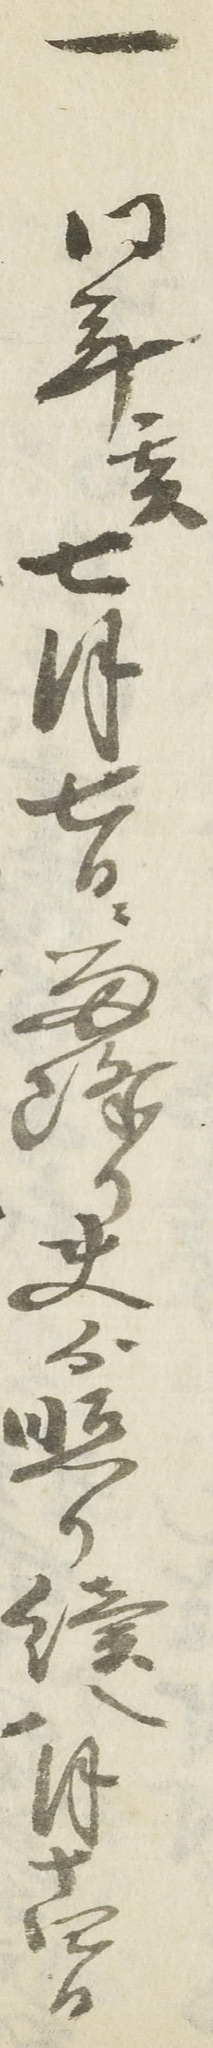一同年亥七月七日ニ雨降り夫ゟ照り続八月十四日
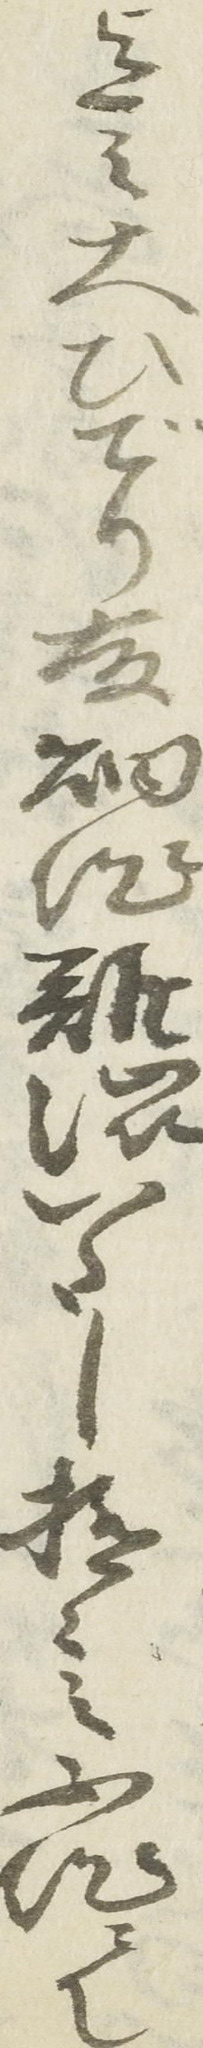迄の大ひでり故畑作難渋いたし極々之不作ニて
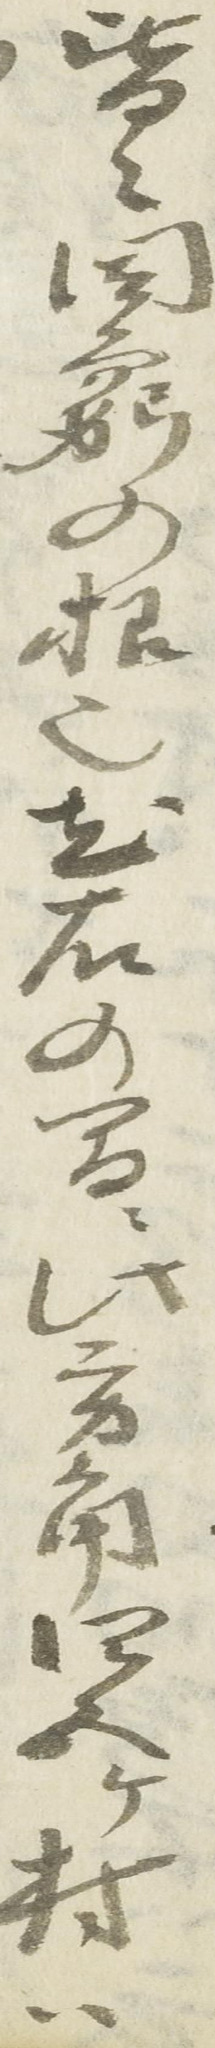皆々困窮の様也尤右の間ニ此方角四五ケ村は
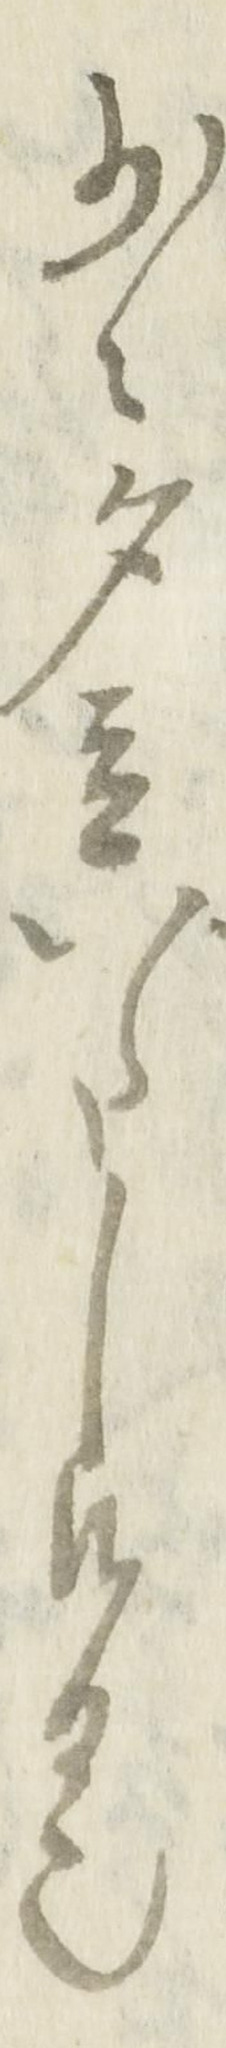少々夕立いたし候か也
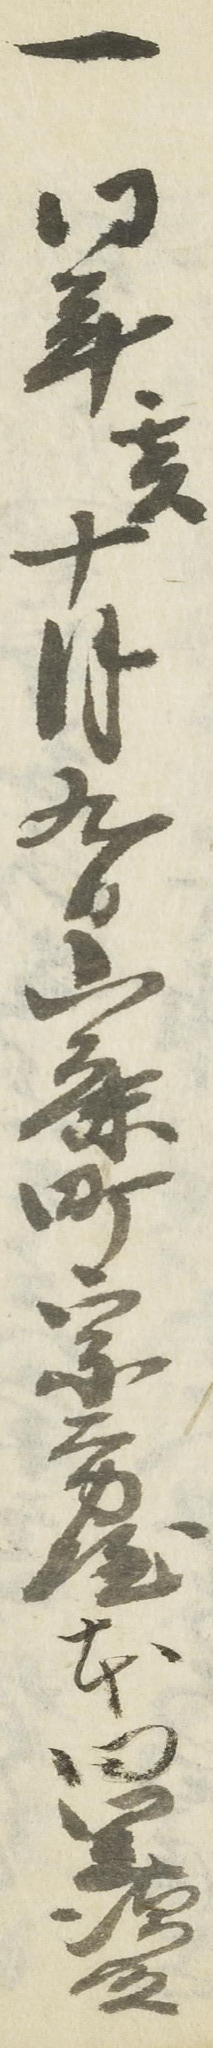一同年亥十月九日山鹿町宗方屋本田里次殿
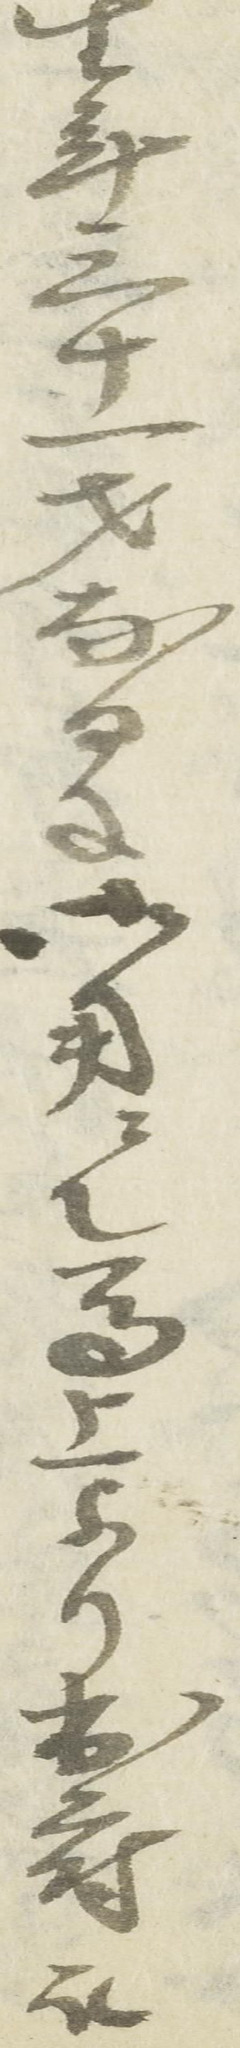生年三十一才なるに御用ニて馬上より出府被
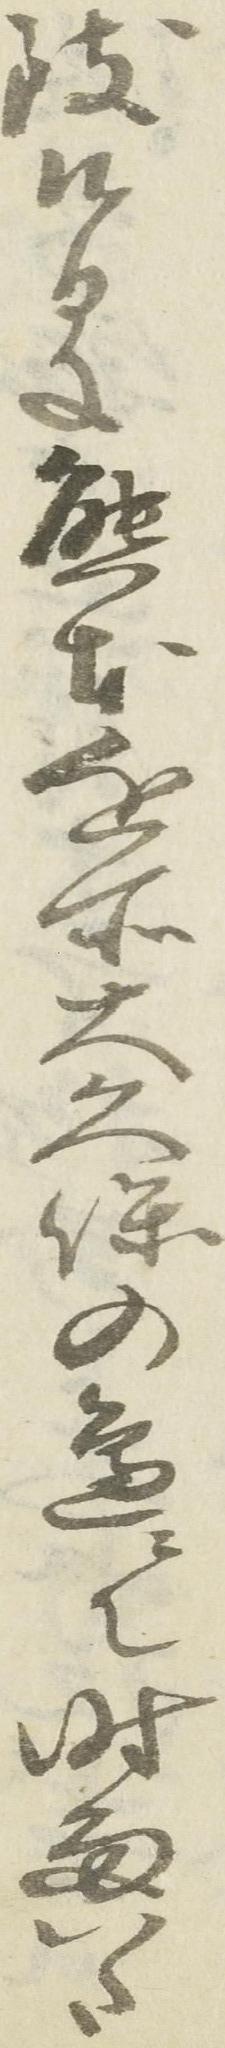致候かに熊本近所大久保の辺ニて時雨いたし
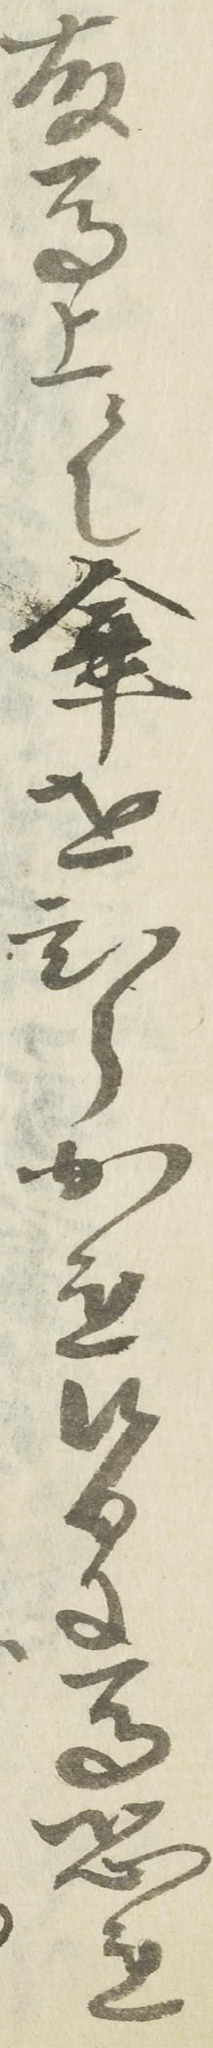故馬上ニて傘をひらかれけるに馬恐れ
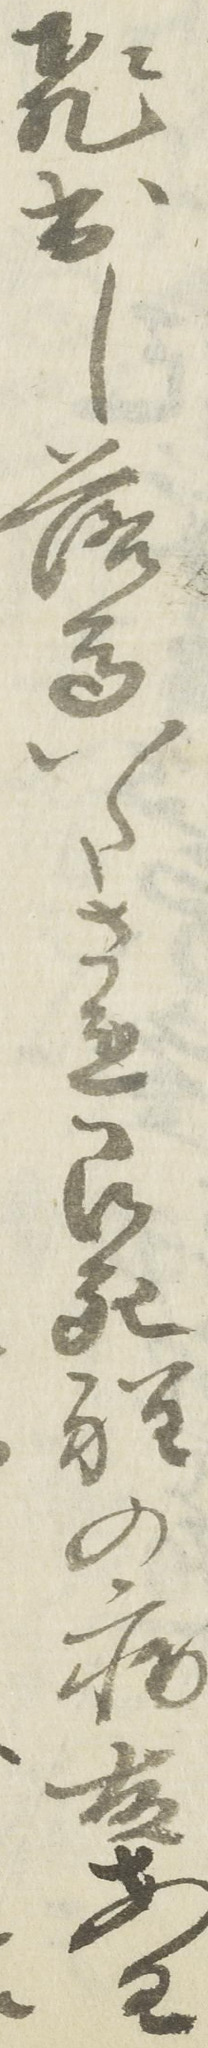飛出し落馬いたされ即死程の病故あわ
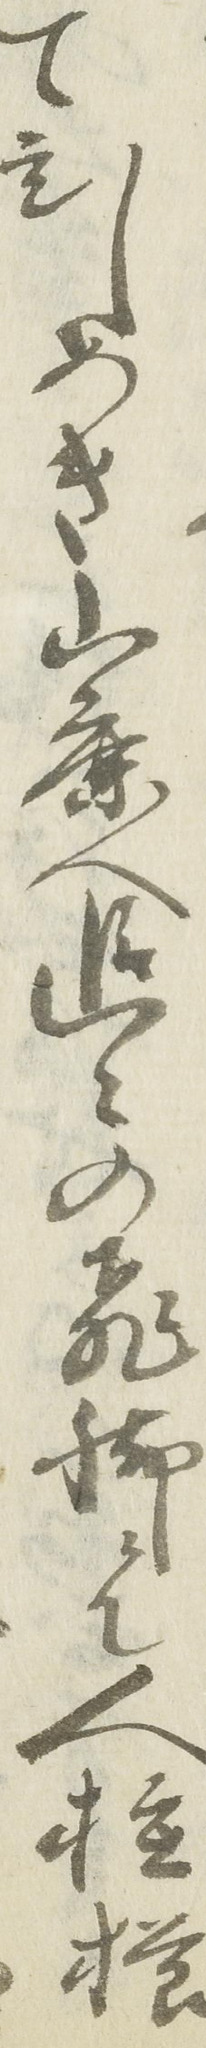てひしめき山鹿へ追々の飛脚ニて人柱櫛
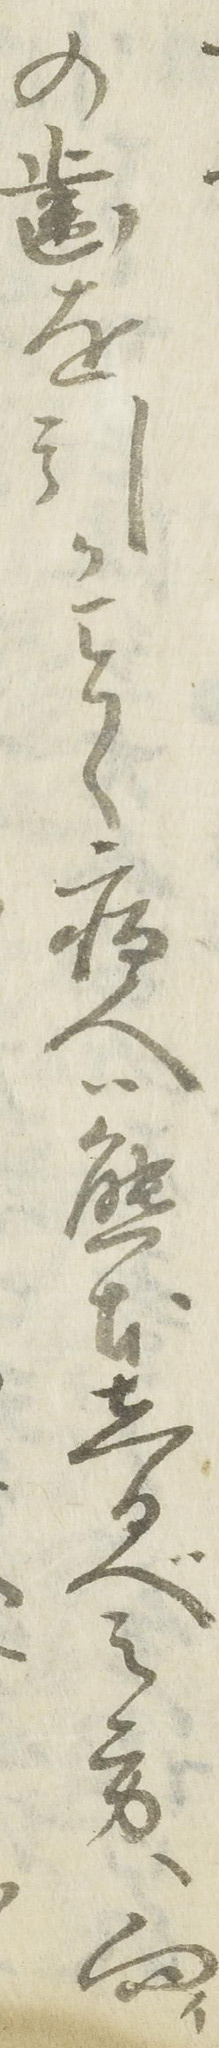の歯を引ことく病人は熊本しるべの方へ向イ
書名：後見笑
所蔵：東京大学地震研究所図書室 Earthquake Research Institute Library, The University of Tokyo, JAPAN
